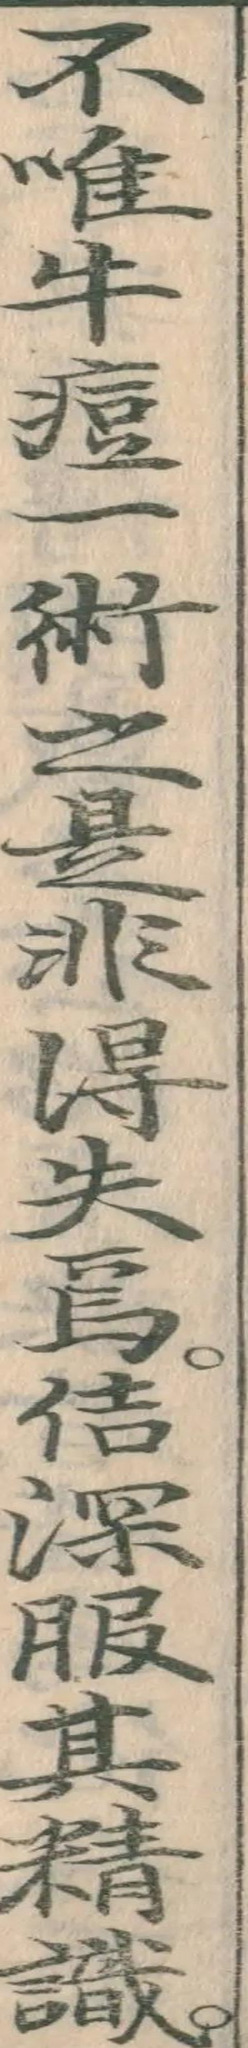不唯牛痘一術之是非得失焉。佶深服其精識。
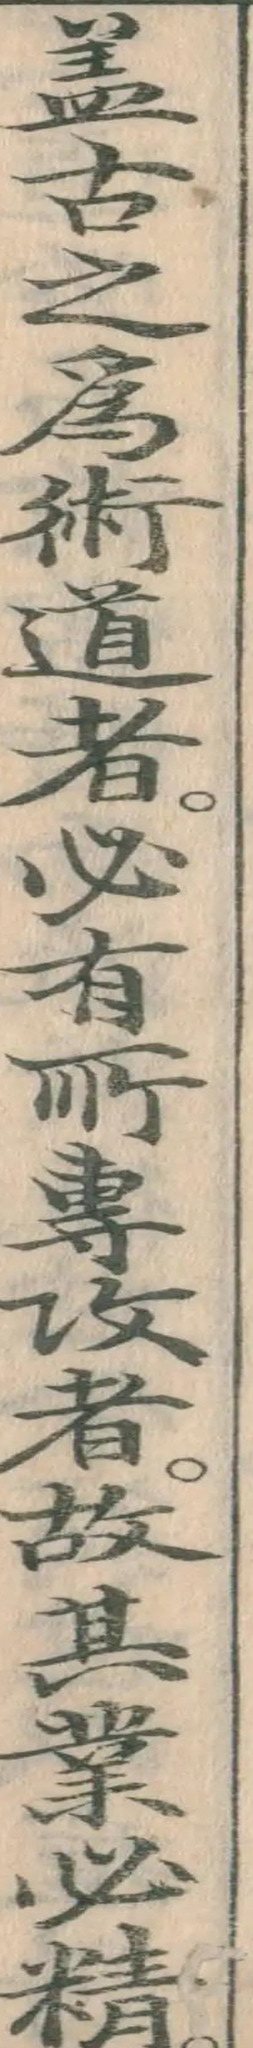蓋古之為術道者。必有所専攻者。故其業必精。

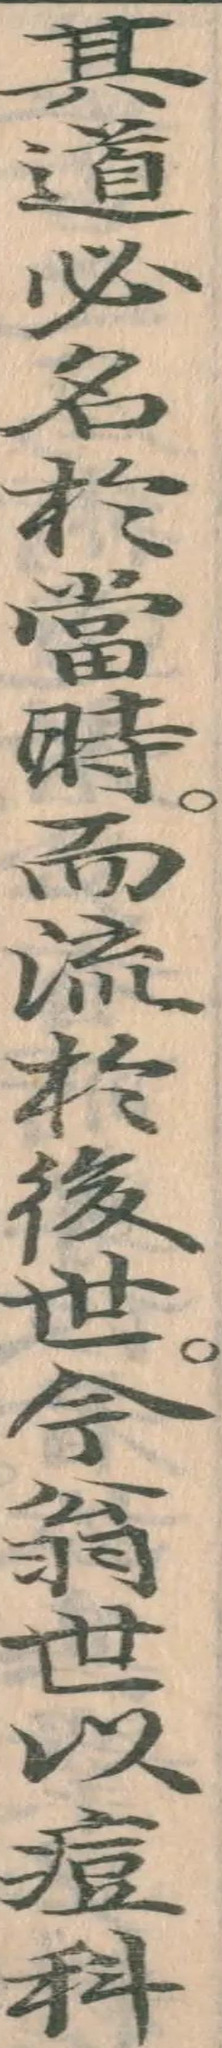其道必名於当時。而流於後世。今翁世以痘科
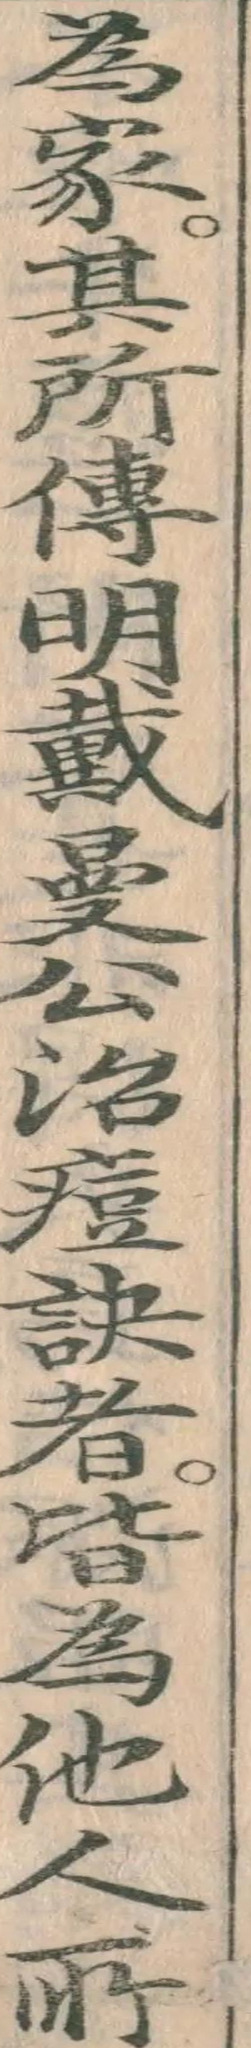為家。其所伝明戴曼公治痘訣者。皆為他人所
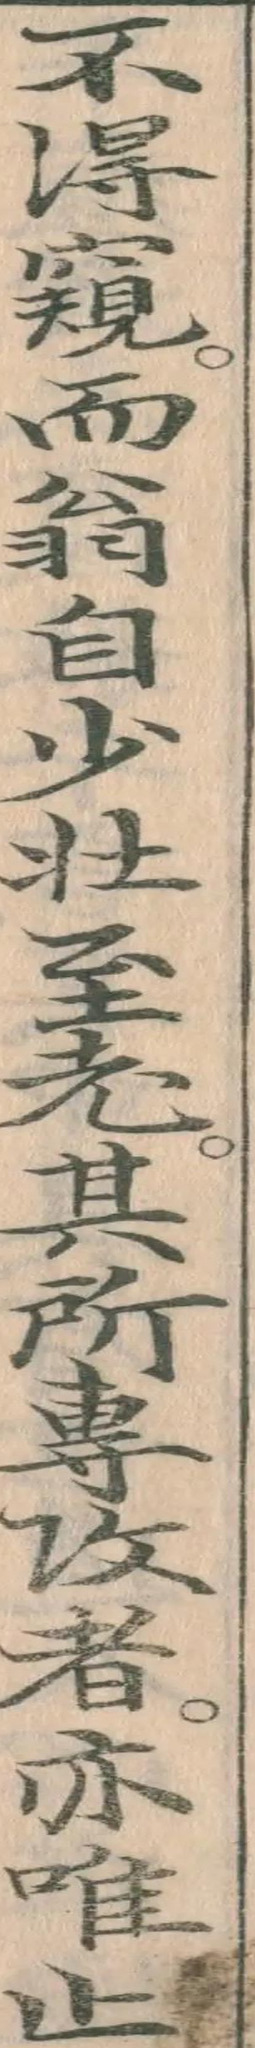不得窺。而翁自少壮至老。其所専攻者。亦唯止
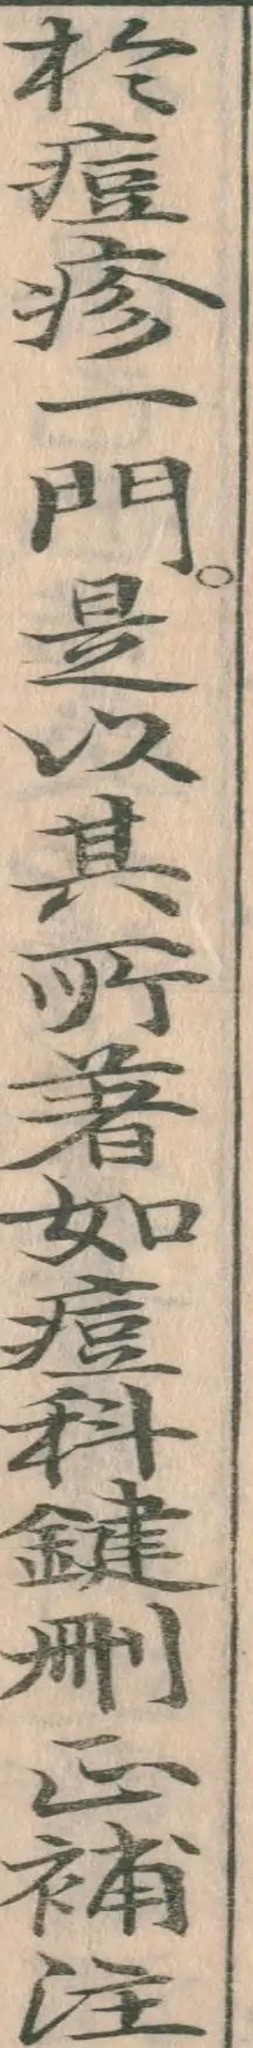於痘疹一門。是以其所著如痘科鍵刪正補注
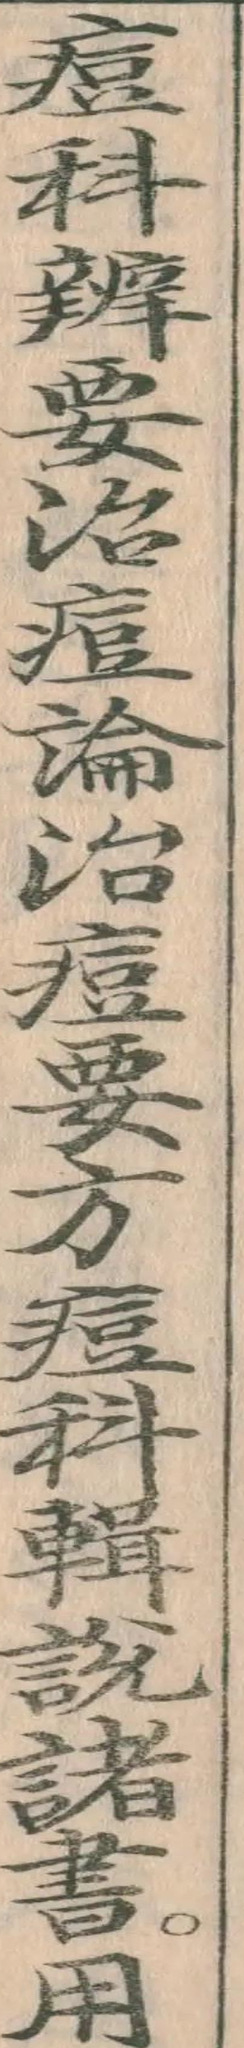痘科弁要治痘論治痘要方痘科輯説諸書。用
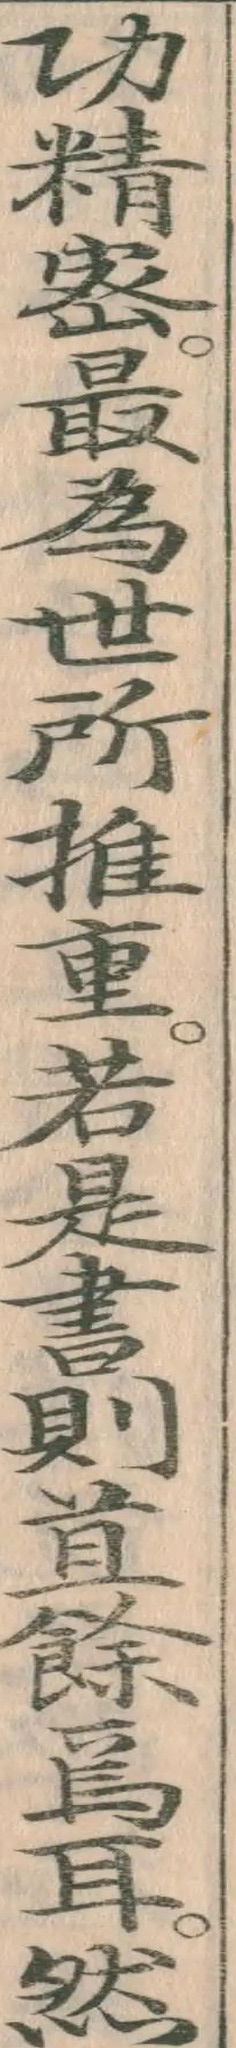功精密。最為世所推重。若是書則苴余焉耳。然
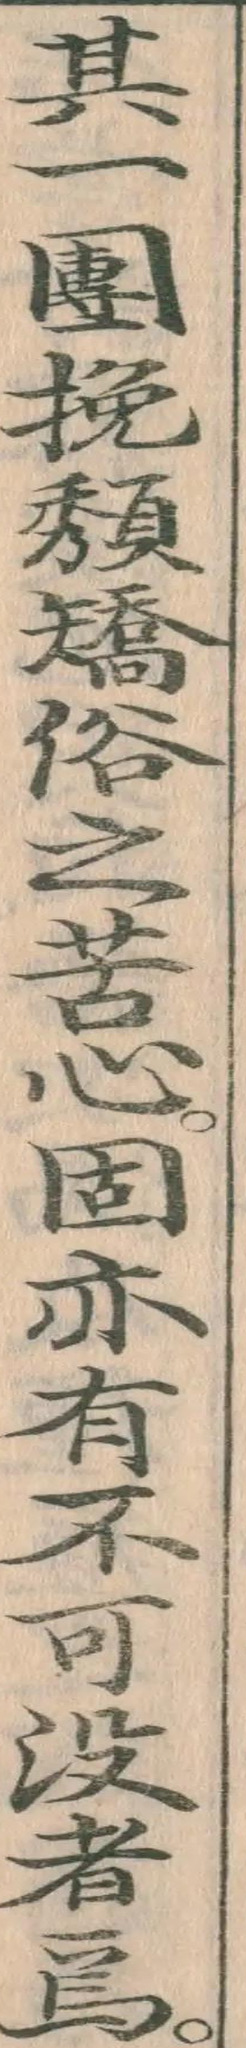其一団挽頽矯俗之苦心。固亦有不可没者焉。
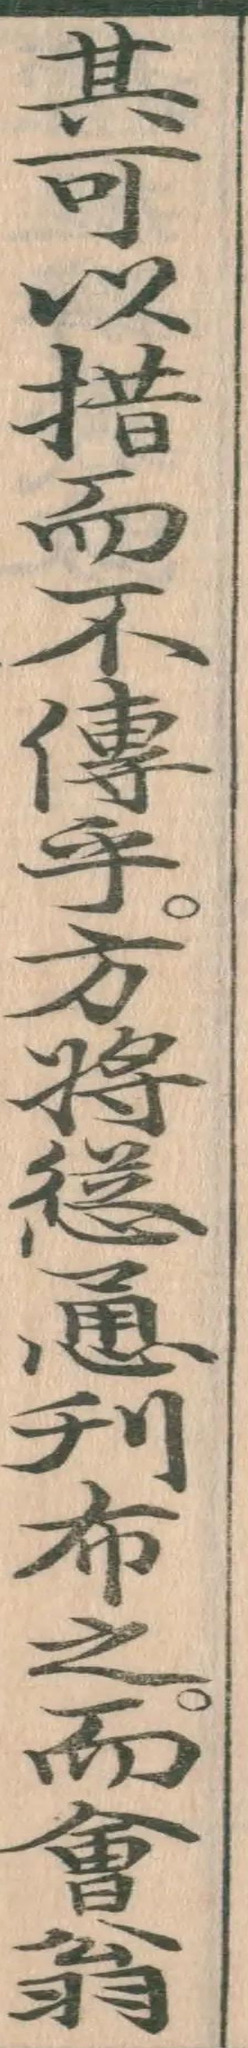其可以措而不伝乎。方将慫通刊布之。而会翁
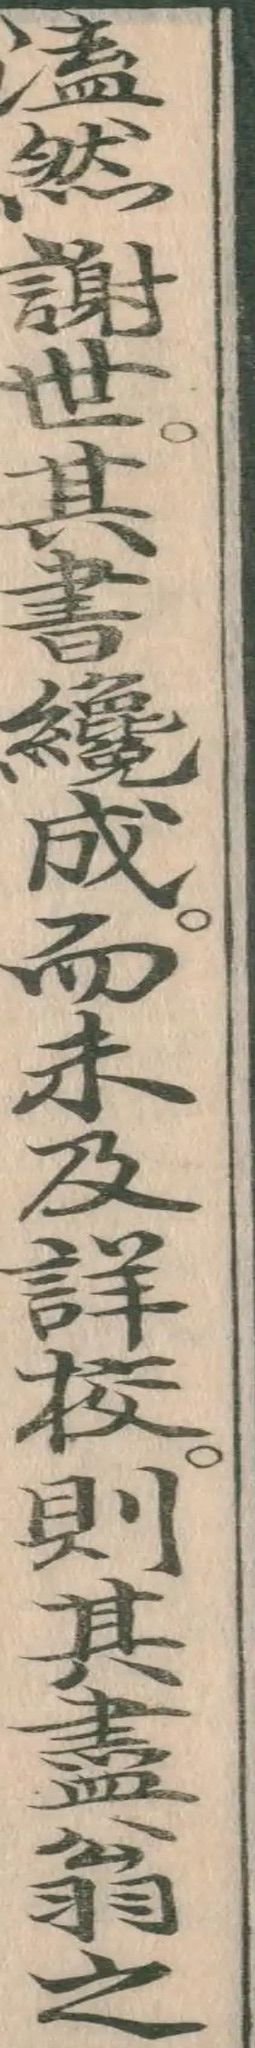溘然謝世。其書纔成。而未及詳校。則其尽翁之
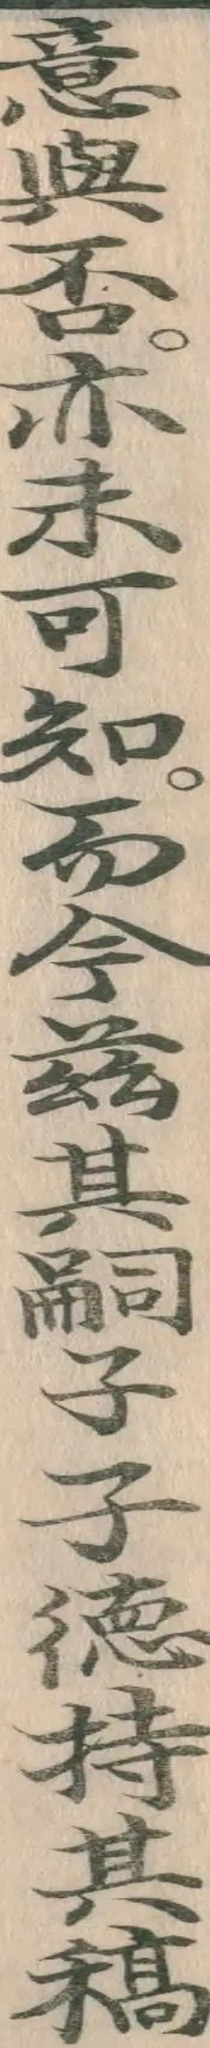意与否。亦未可知。而今茲其嗣子子徳持其稿
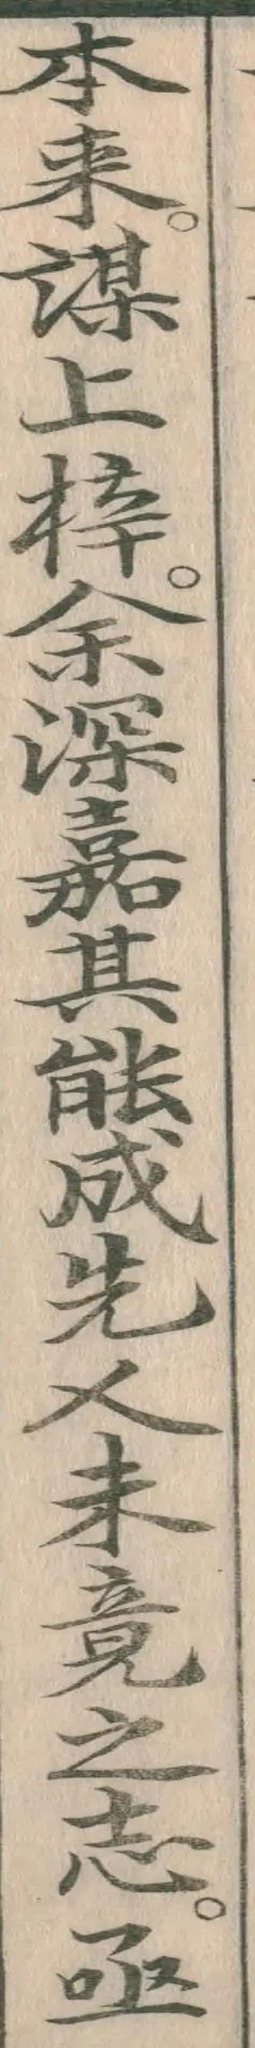本来。謀上梓。余深嘉其能成先人未竟之志。亟
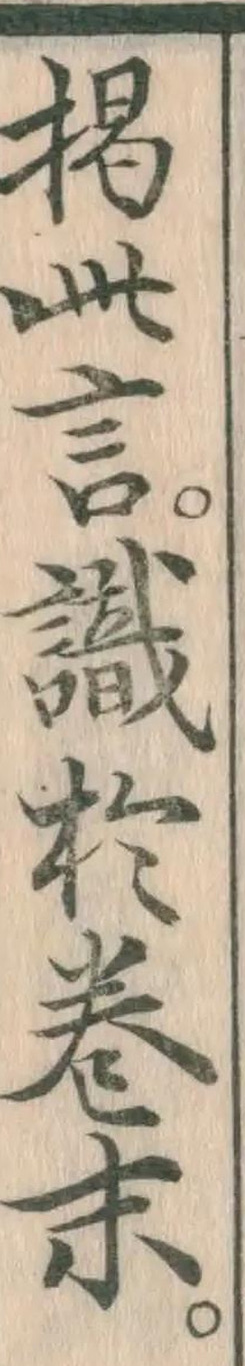掲此言。識於巻末。
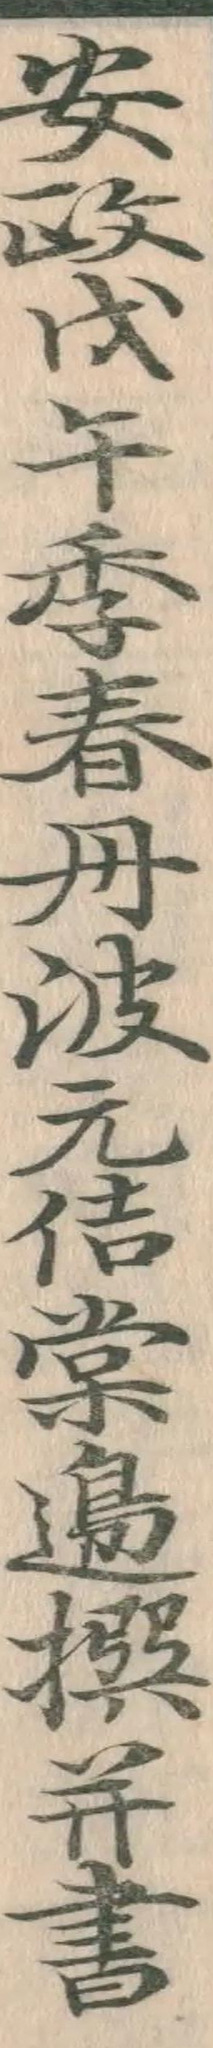安政戌午季春丹波元佶棠辺撰并書

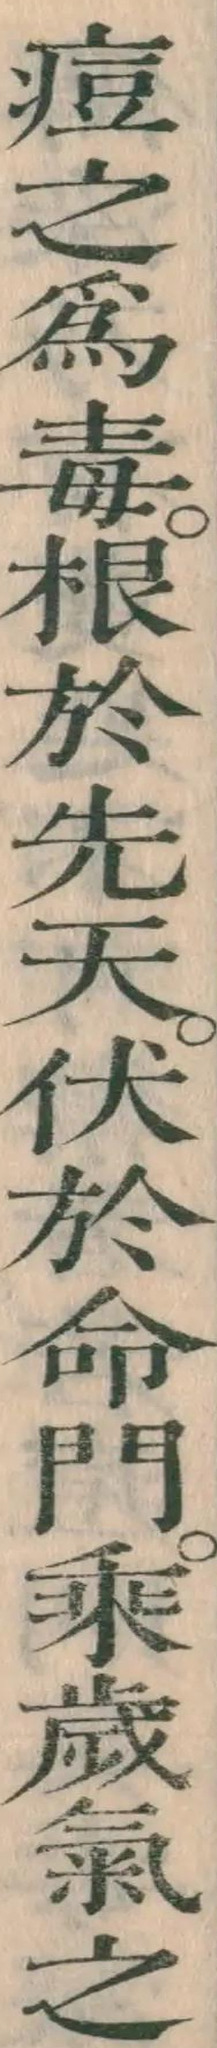痘之為毒。根於先天。伏於命門。乗歳気之
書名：種痘弁義
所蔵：国立国会図書館 National Diet Library, JAPAN
